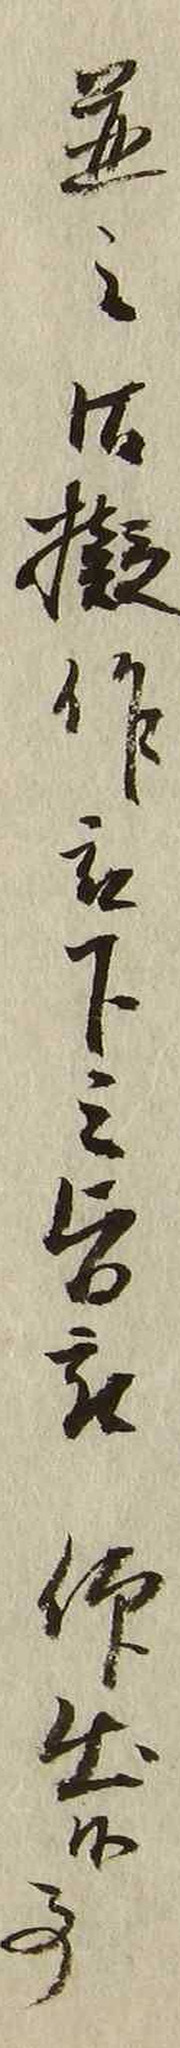並之御擬作被下之旨仰出候事
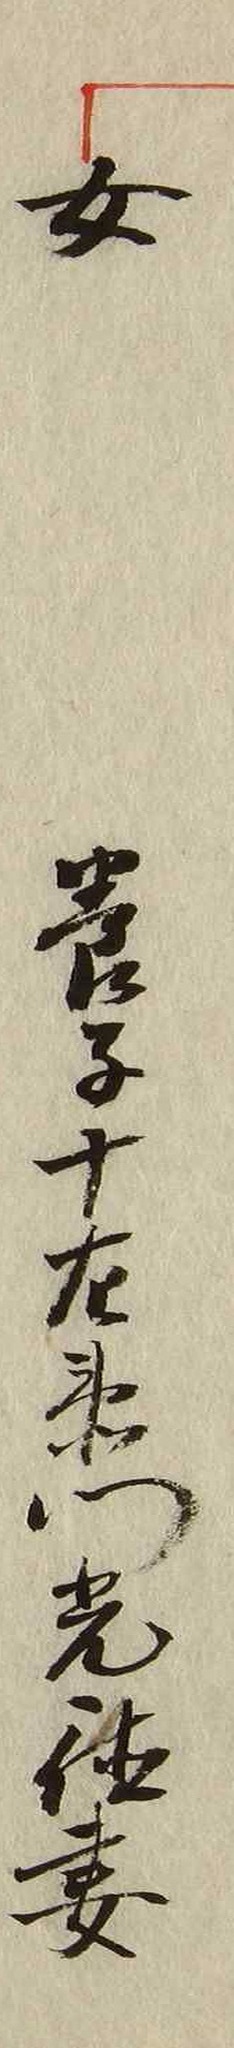女養子十左衛門光徳妻
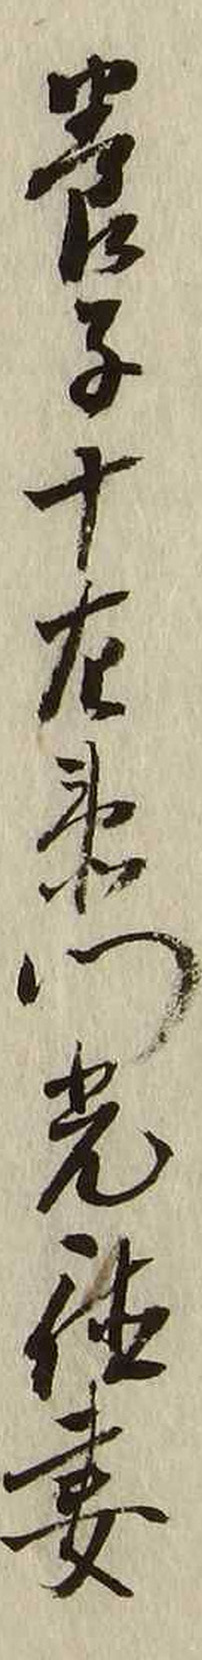女養子十左衛門光徳妻
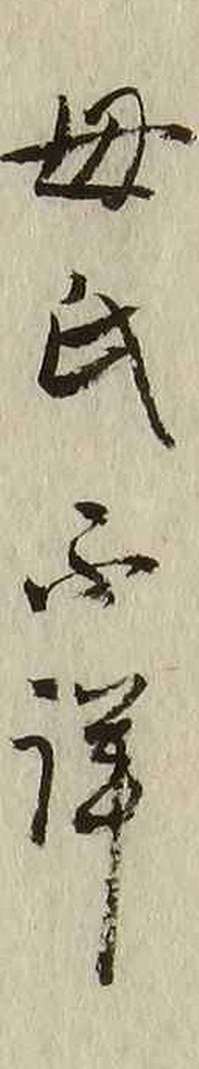母氏不詳
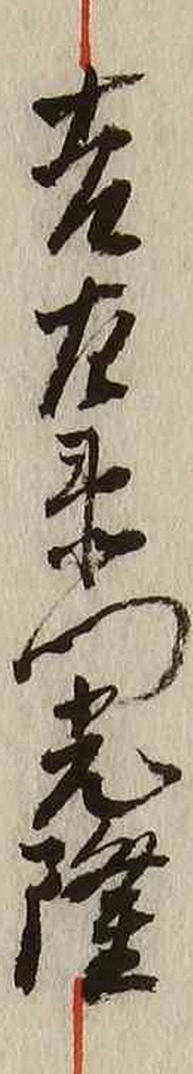吉左衛門光隆
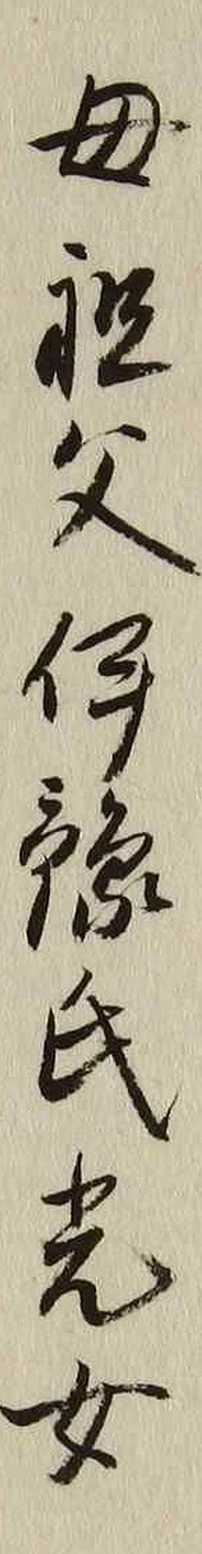母祖父伊予氏光女
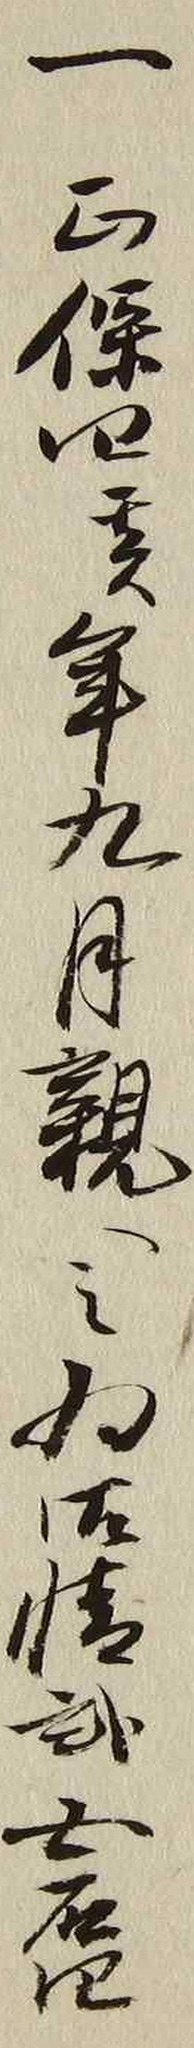一正保四亥年九月親へ之為御情哉五石四
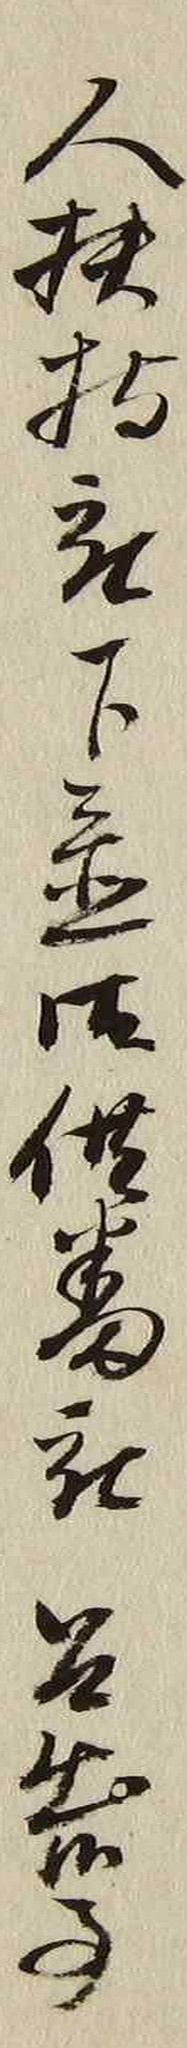人扶持被下置御供番被召出候事
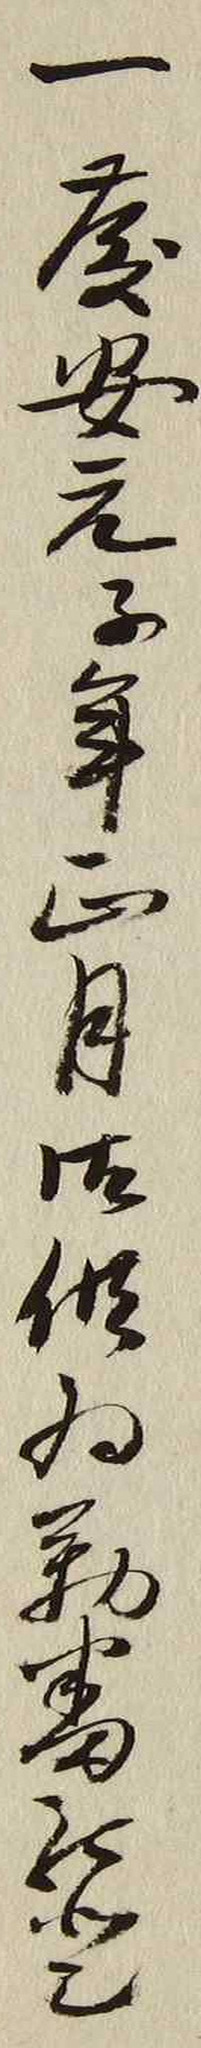一慶安元子年正月御供為勤番罷登
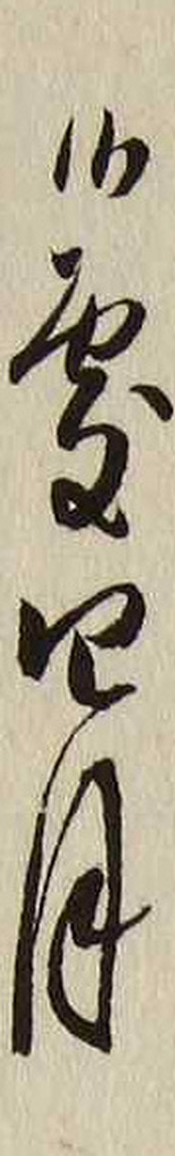候処四月
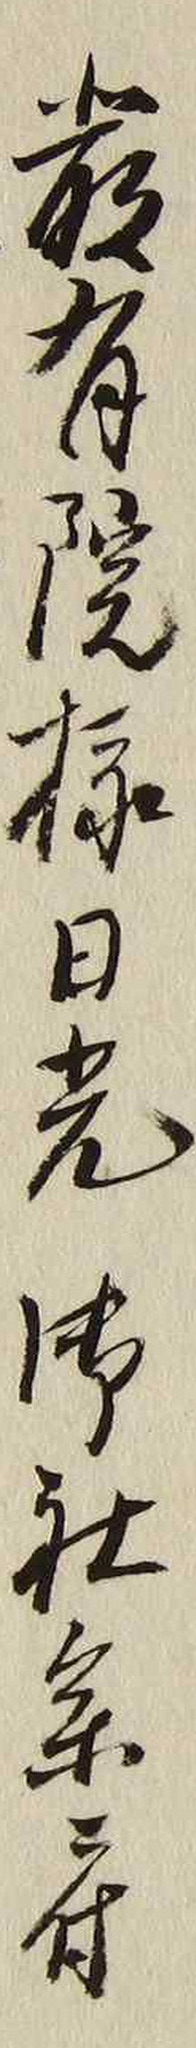厳有院様日光御社参ニ付
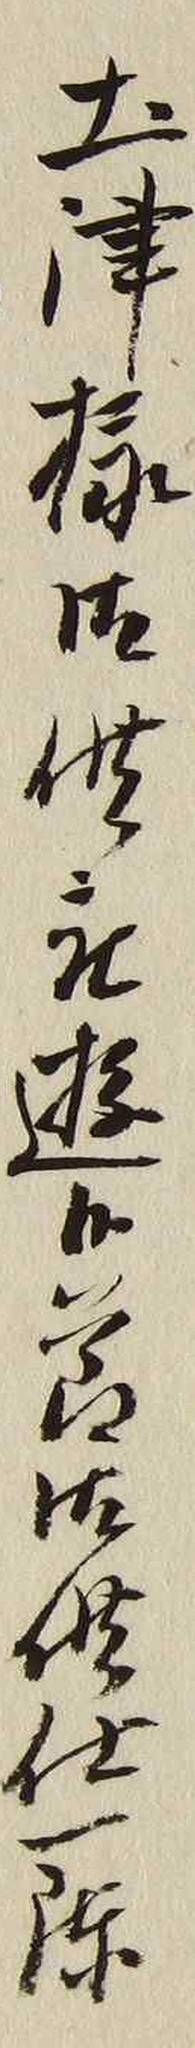土津様御供被遊候節御供仕一陣
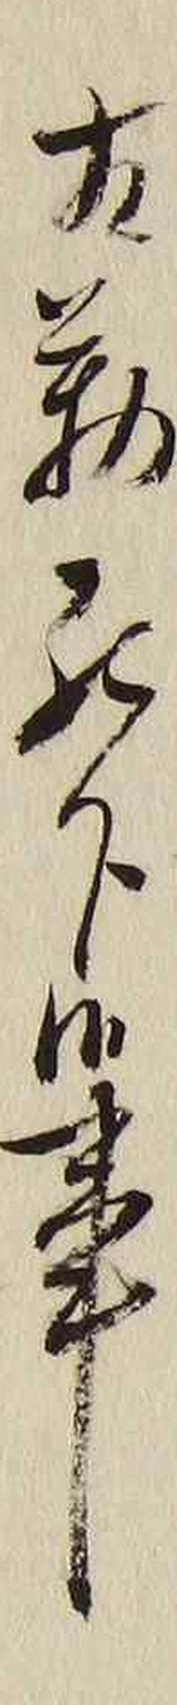相勤罷下候事

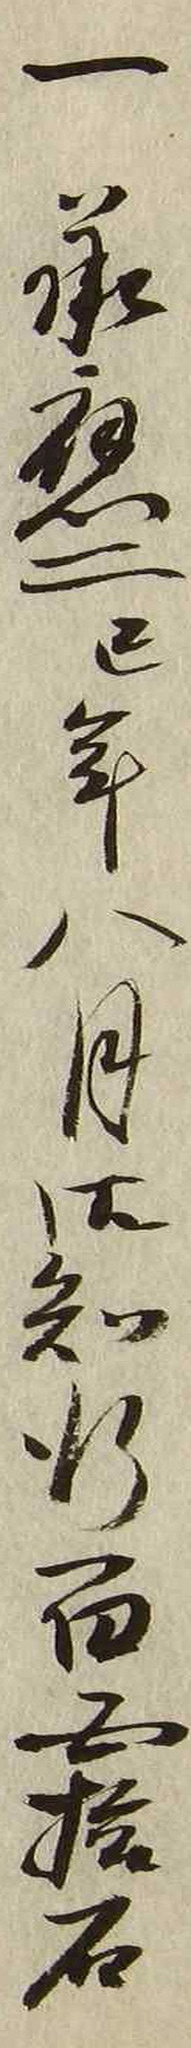一承応二巳年八月御知行百五拾石
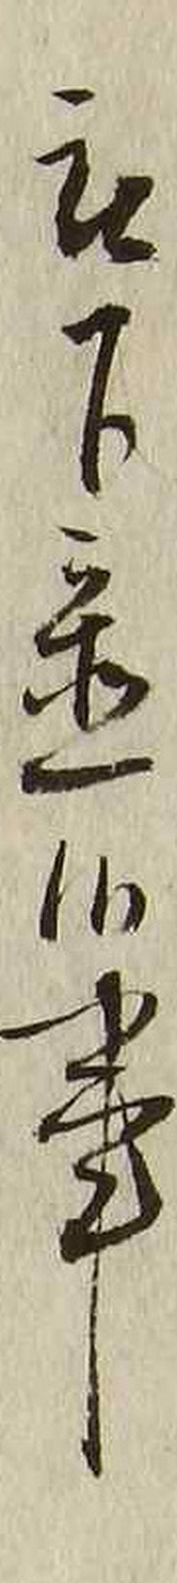被下置候事
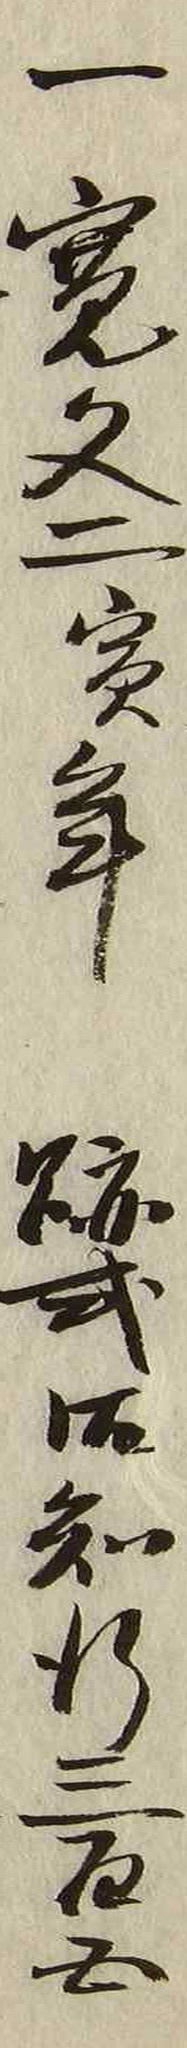一寛文二寅年跡式御知行三百五
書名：諸士系譜　巻之356　す之部6
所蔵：会津若松市立会津図書館
